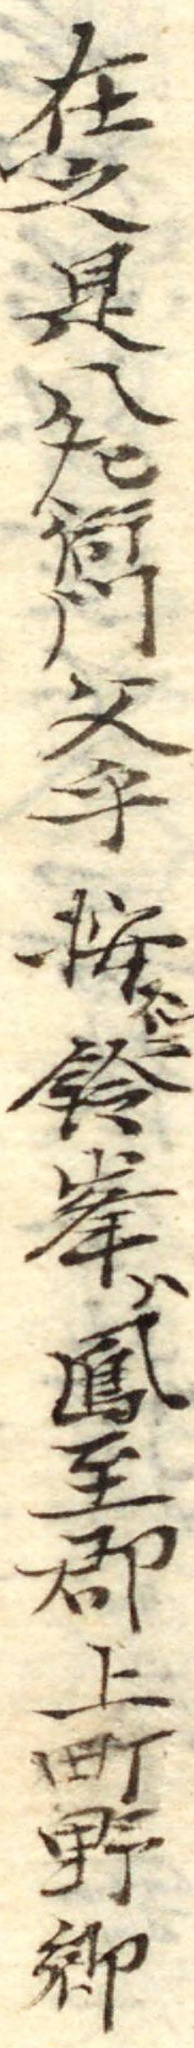在之是八左衛門父乎按するに鈴峯は鳳至郡上町野郷
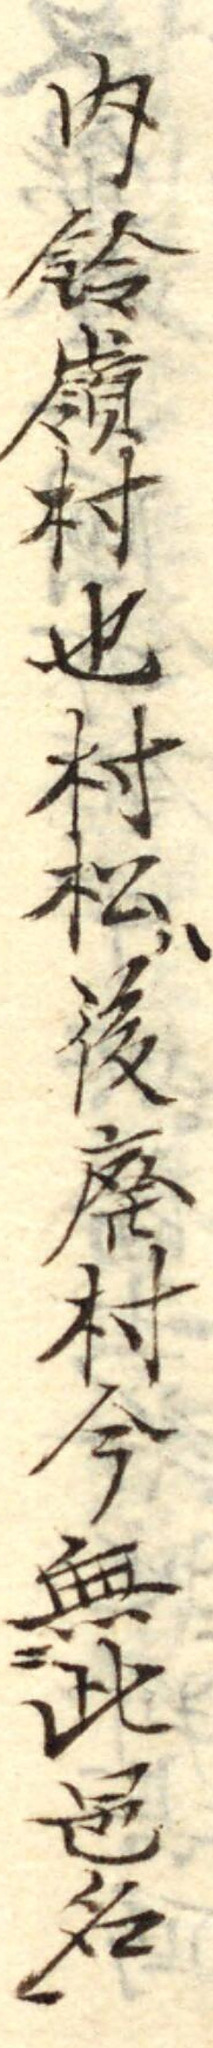内鈴峯村也村松は後廃村今無此邑名
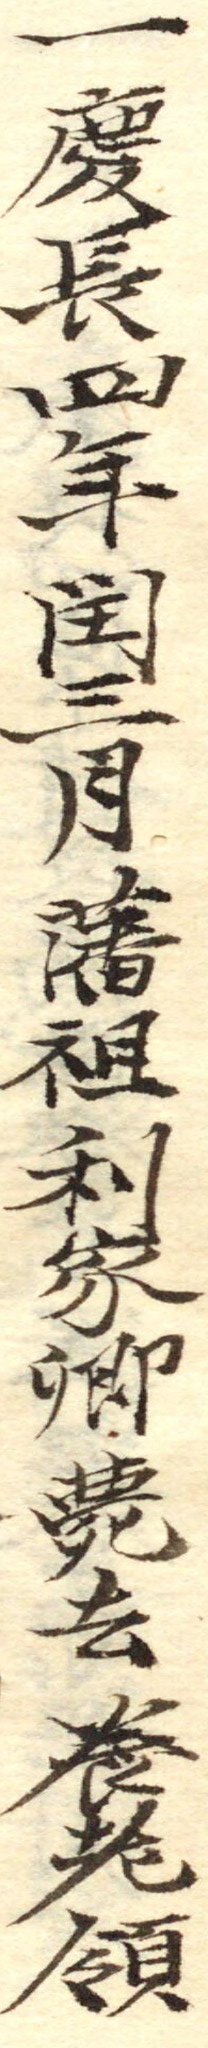一慶長四年閏三月藩祖利家卿薨去養老領
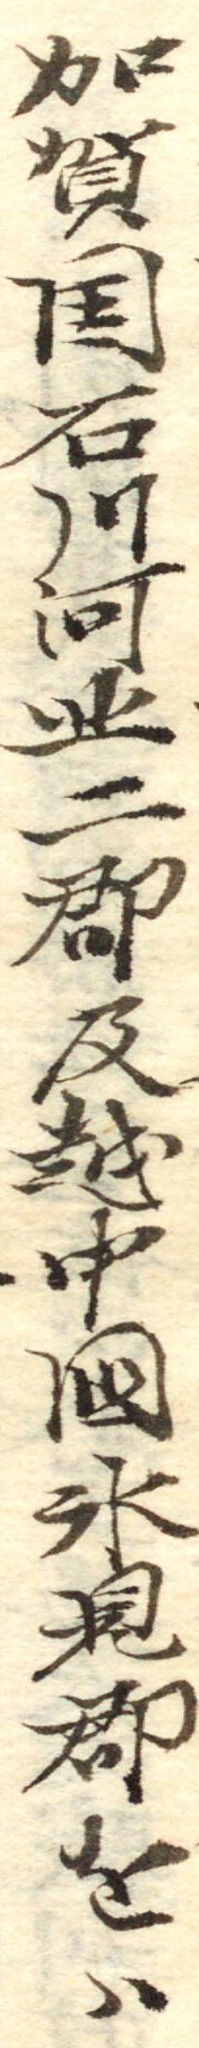加賀国石川河北二郡及越中国氷見郡をは
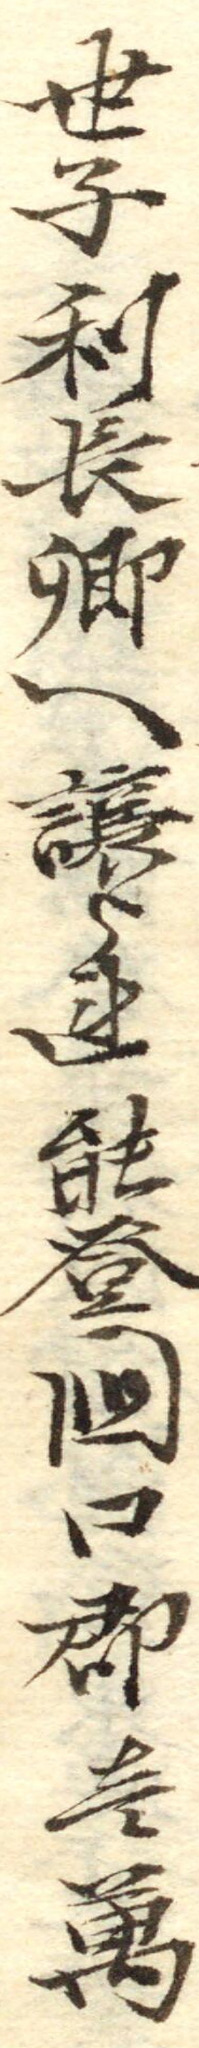世子利長卿へ譲ら連能登国口郡壱萬
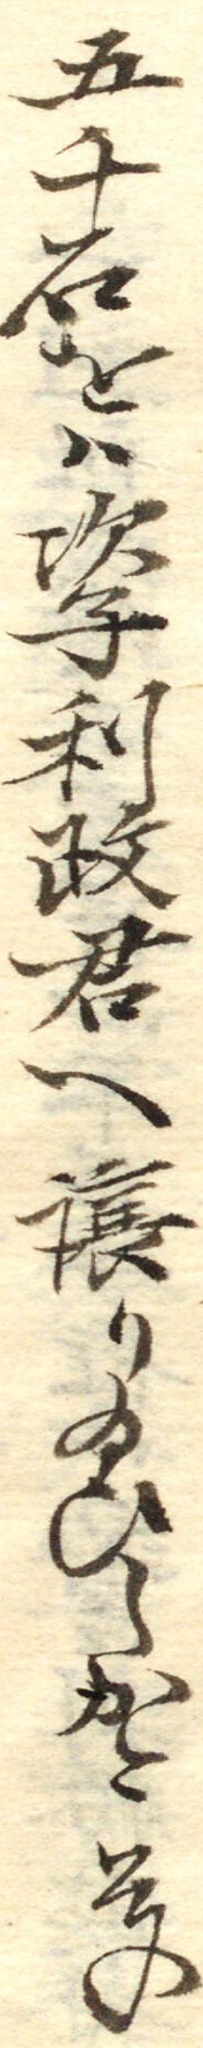五千石をは次子利政君へ譲りゐひしかとその
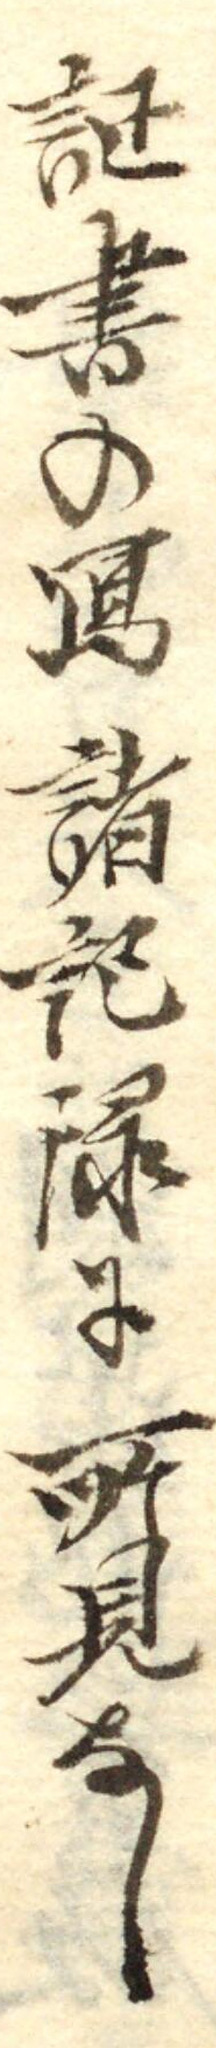証書の写諸記録尓所見なし
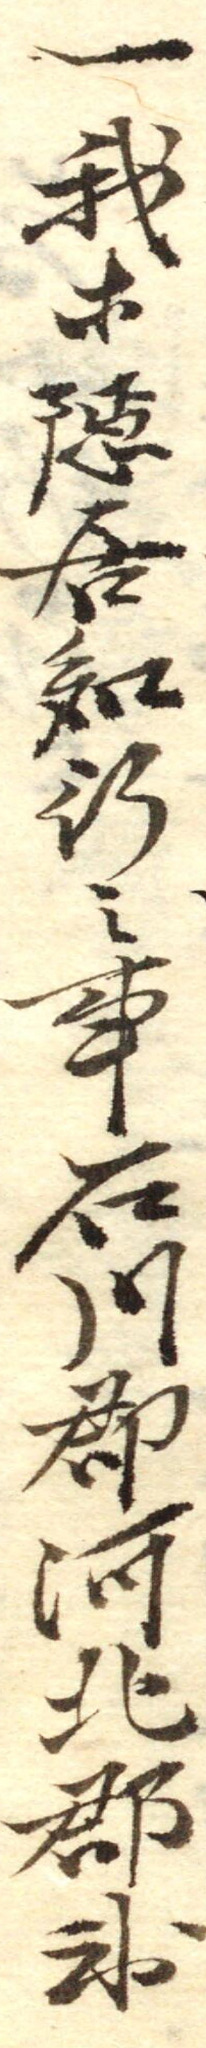一我等隠居知行之事石川郡河北郡氷
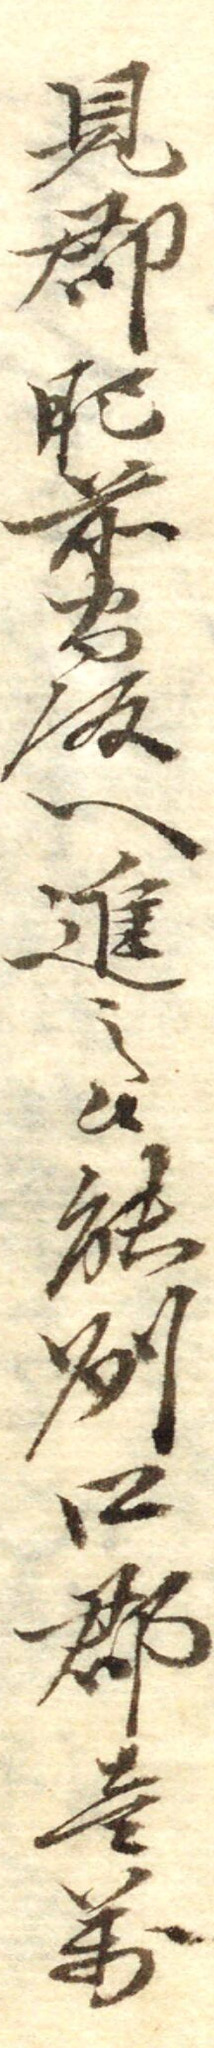見郡肥前守殿へ進之候能州口郡壱萬
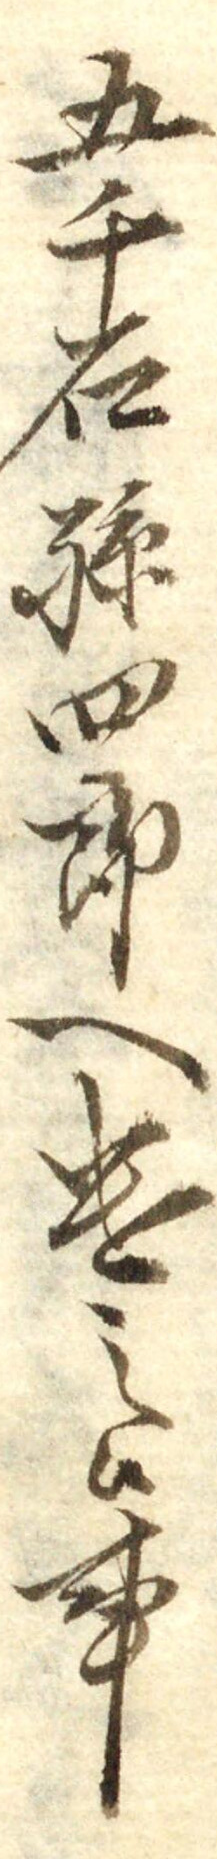五千石孫四郎へ遣之候事
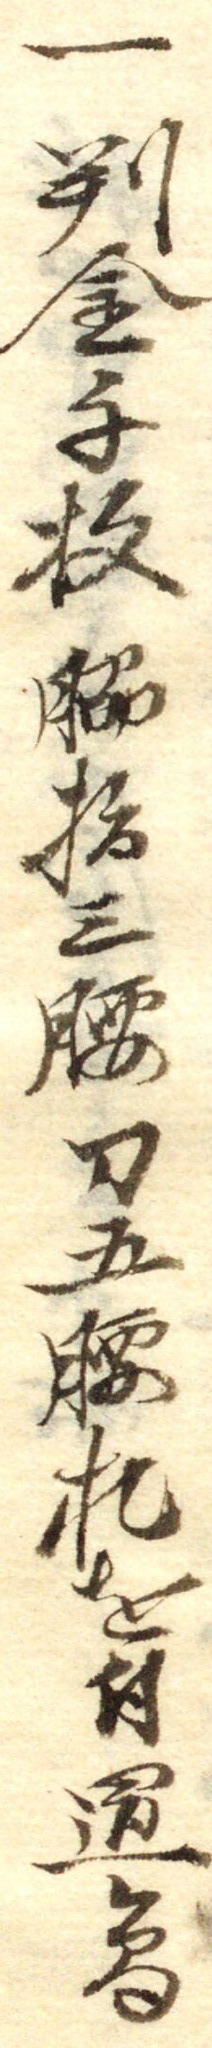一判金千枚脇指三腰刀五腰札を付置候間

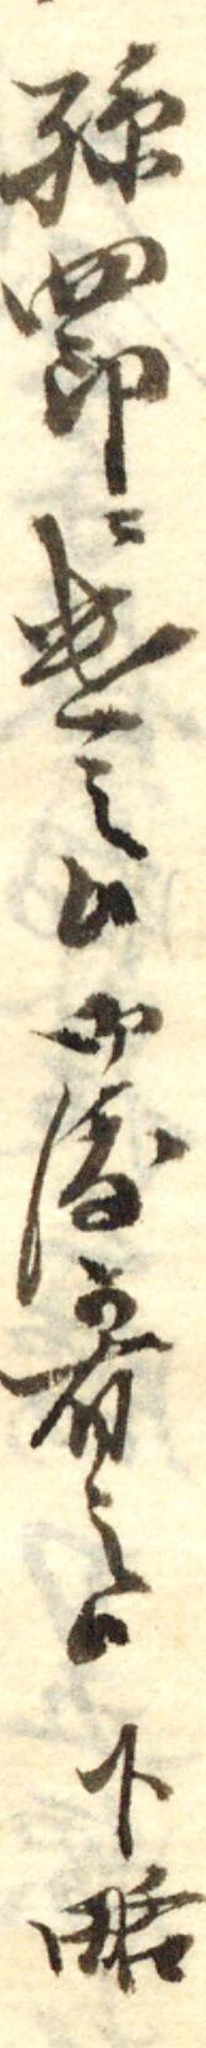孫四郎に遣之候御渡可有之候下略
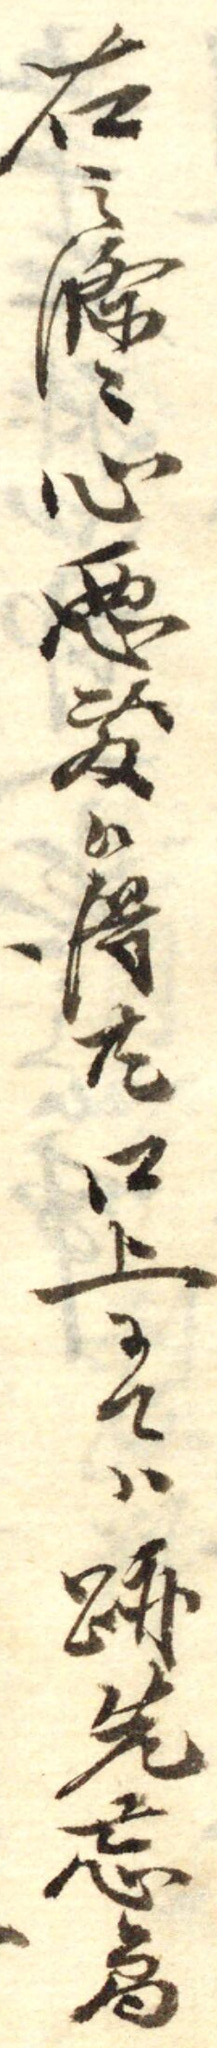右之條々心悪敷候得共口上尓ては跡先忘候間
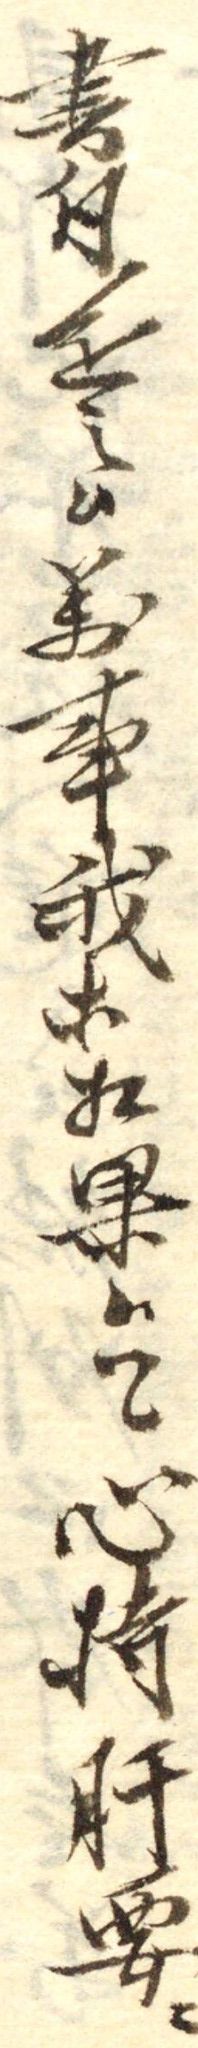書付進之候万事我等相果候はゝ心持肝要に
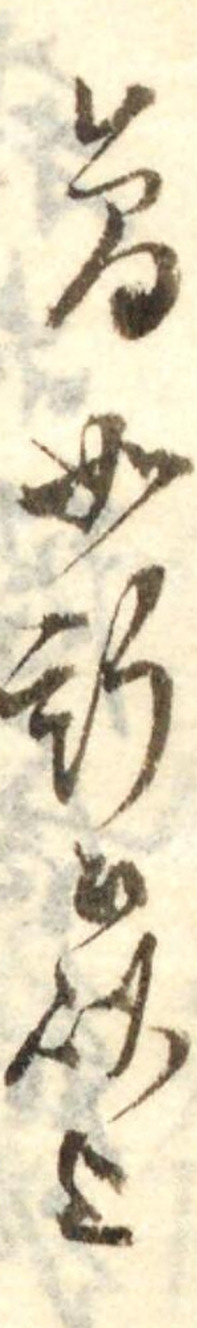候間如斯候以上
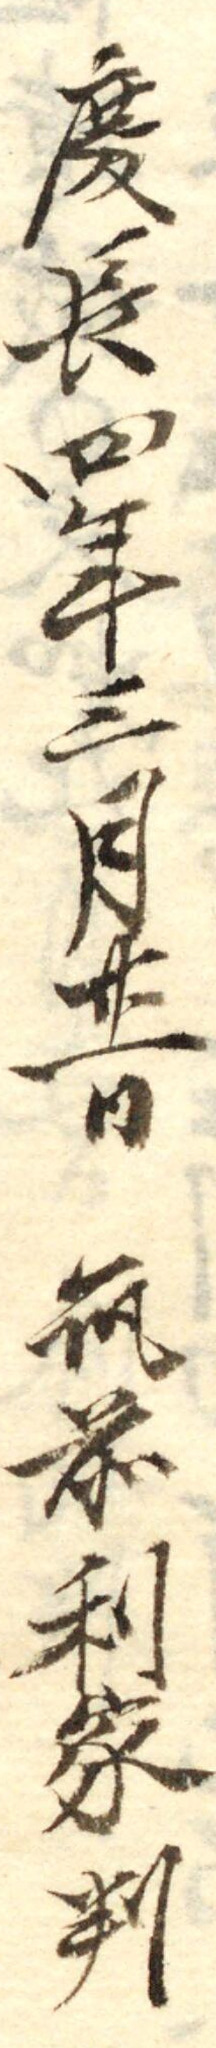慶長四年三月廿一日筑前利家判
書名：前田家封国証書集録
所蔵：Ishikawa Prefectural Library
